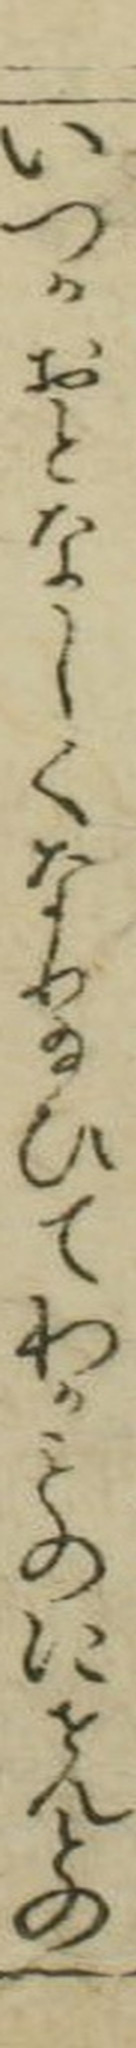いつかおとなしくなり給ひてわかものにせんとの
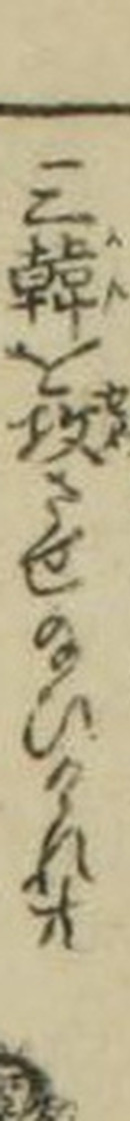三韓を攻させ給ひけれ共
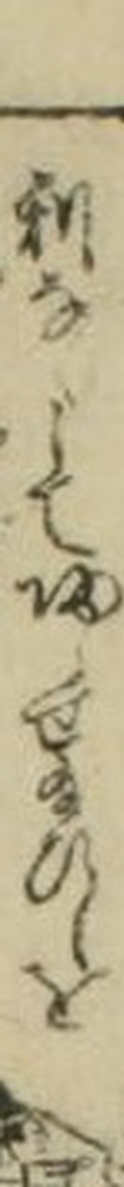利なくして帰らせ給ひしを
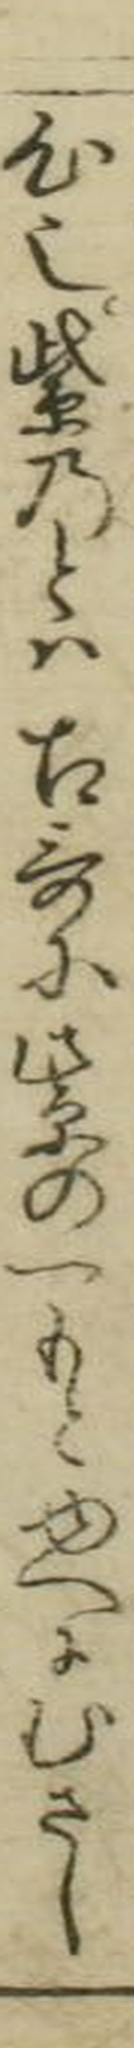心也。紫のとは古哥に紫の一もとゆへにむさし
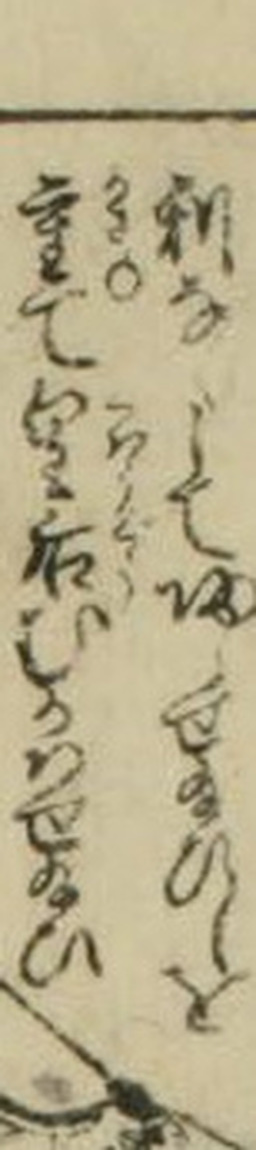重て皇后むかはせ給ひ
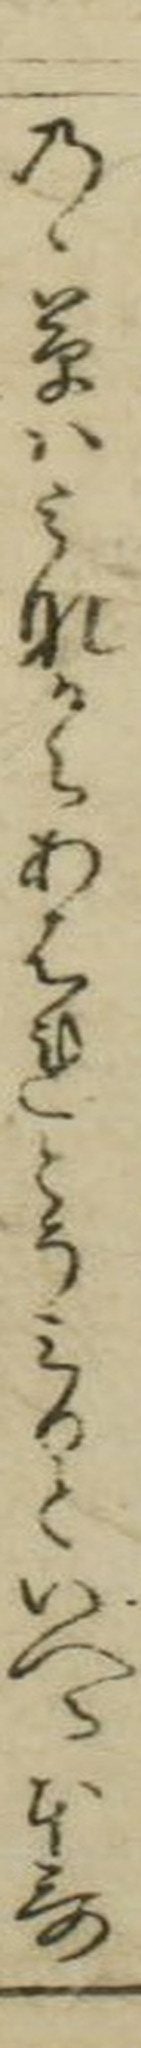のゝ草はみなからあはれとそみるといへる本哥
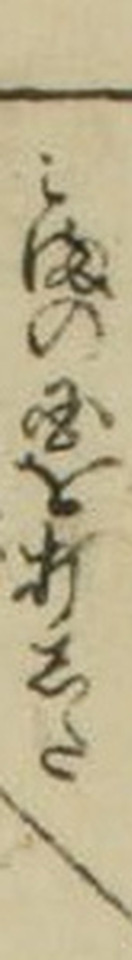こまの国を打した
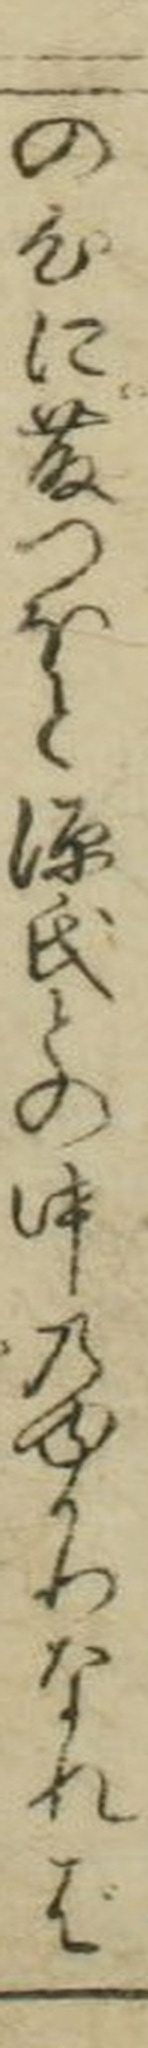の心に。藤つほと源氏との中のゆかりなれば
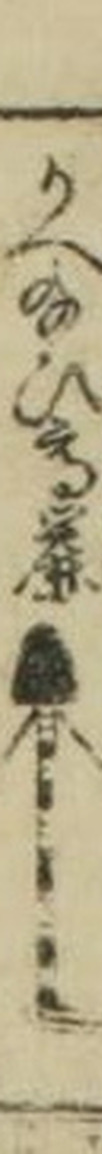かへ給ひ高麗
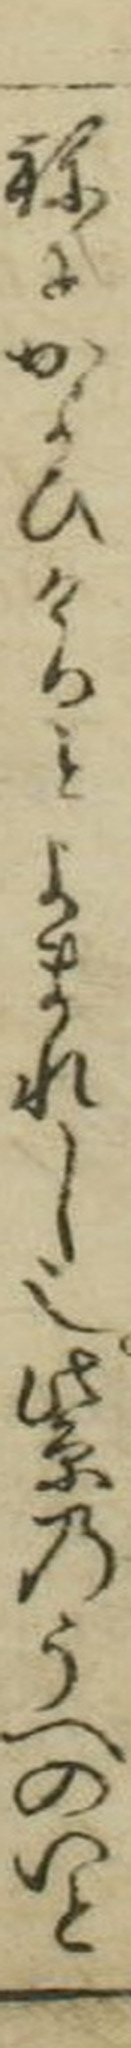ねにかよひけることよまれし也。紫のうへのいと
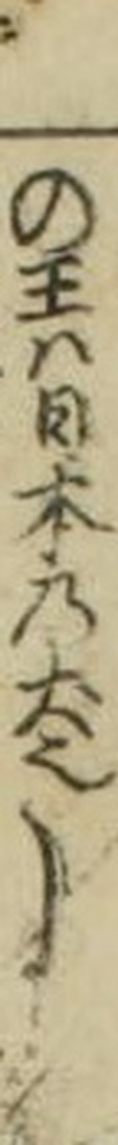の王は日本の犬也
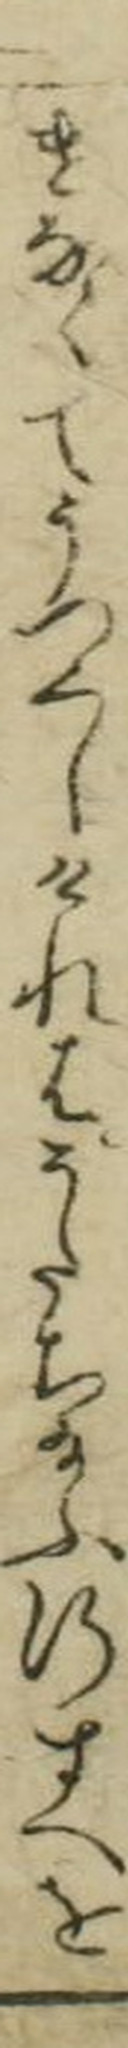けなくてうつくしけれは。そたち給ふ行すへを
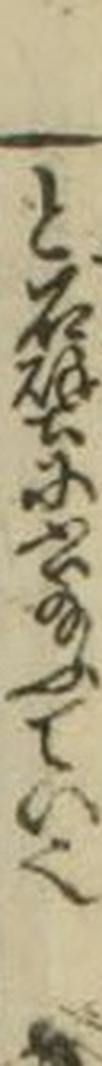と石壁に書給ふてい也
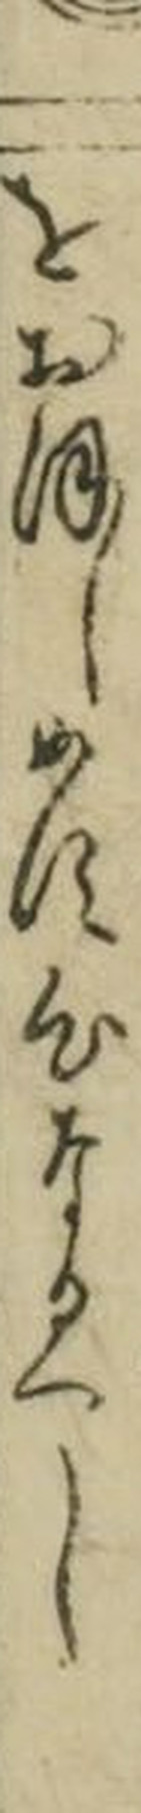をおほしめす心なるへし
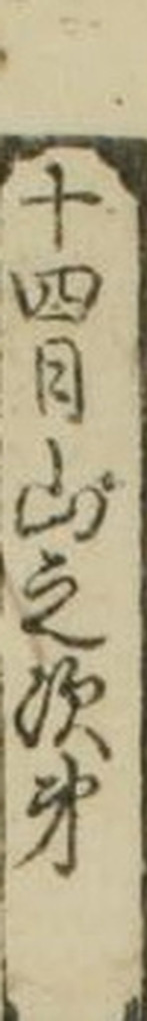十四日山之次第
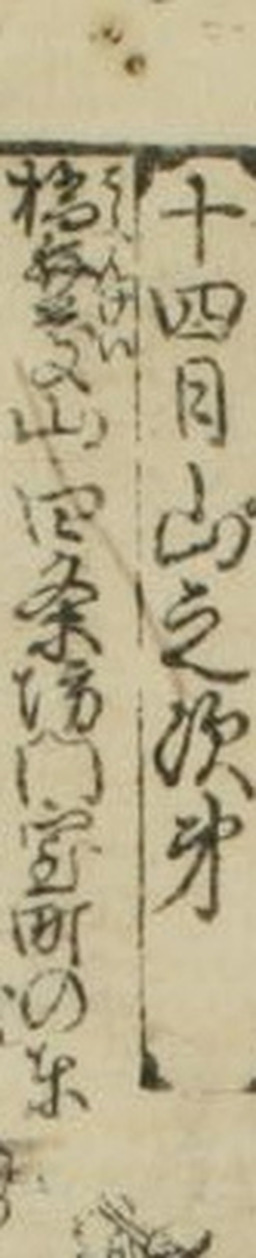橋弁慶山四条坊門室町の東
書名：女源氏教訓鑑
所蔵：東京学芸大学附属図書館
